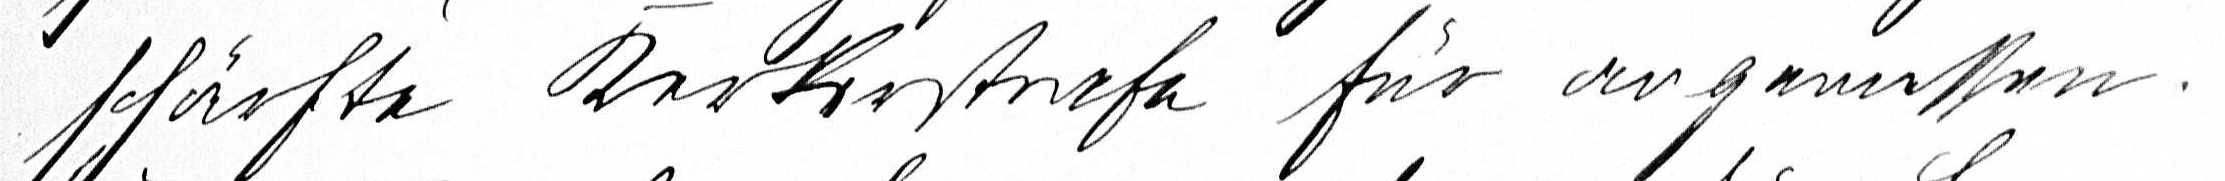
schärfte Kerkerstrafe für angemessen.
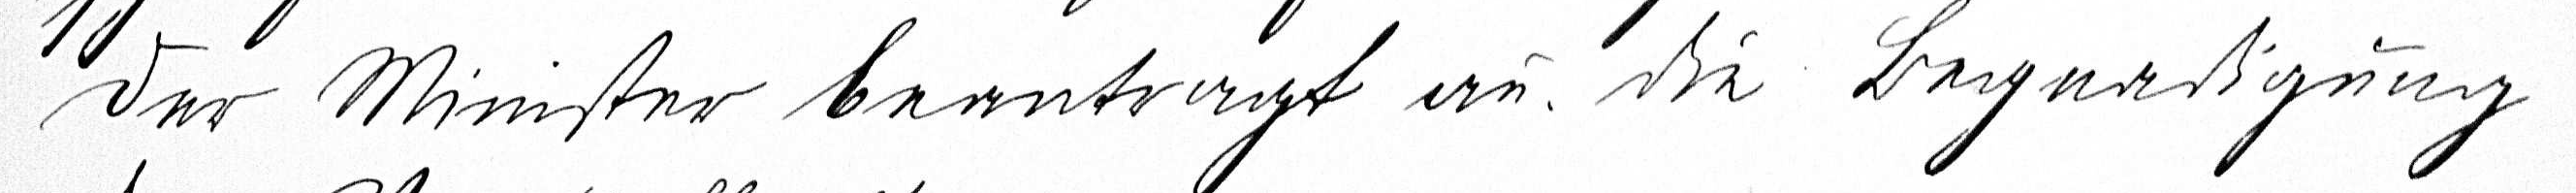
Der Minister beantragt au. die Begnadigung
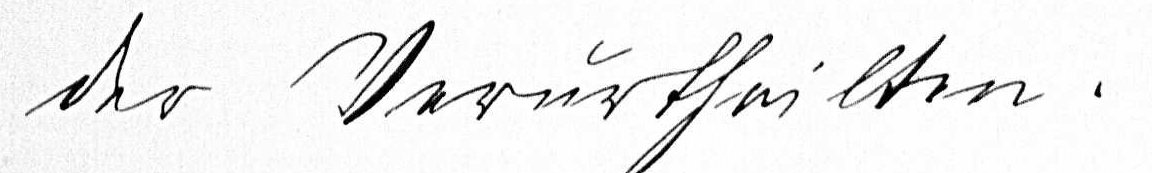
der Verurtheilten.
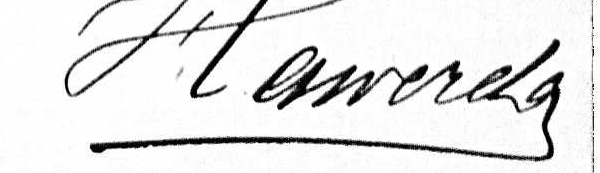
Hawerek
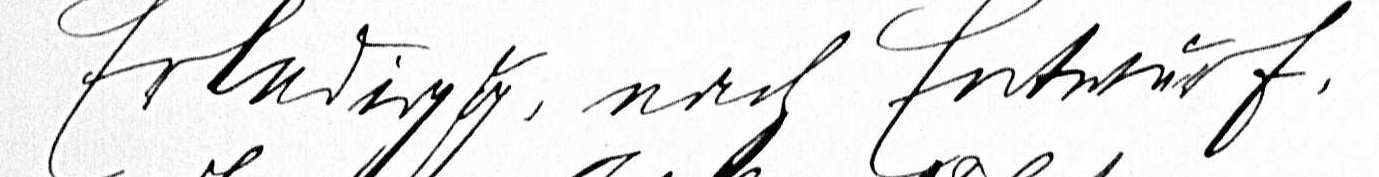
Erledigung, nach Entwurf
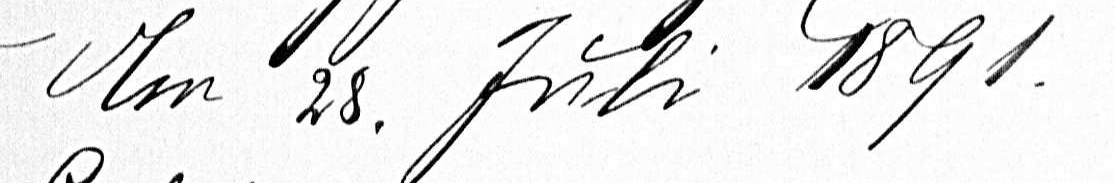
Am 28. Juli 1891
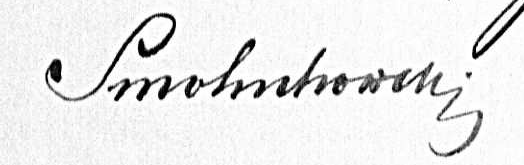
Smolnchowski
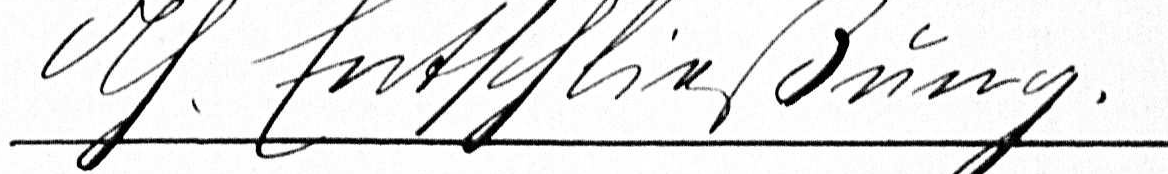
Ah Entschließung
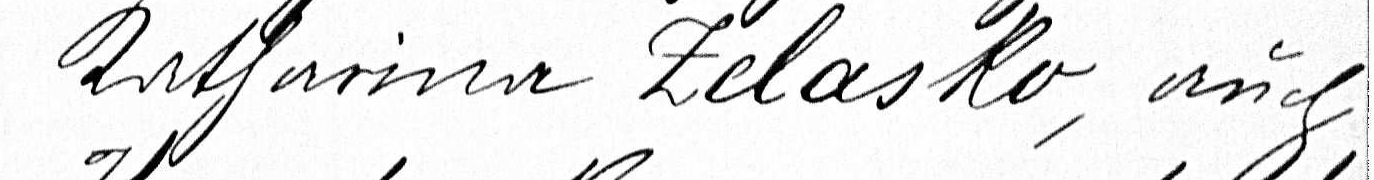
Katharina Želasko, auch
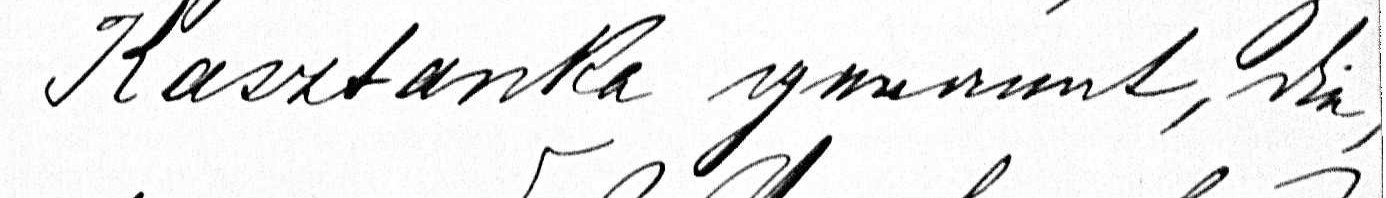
Kasztanka genannt, die
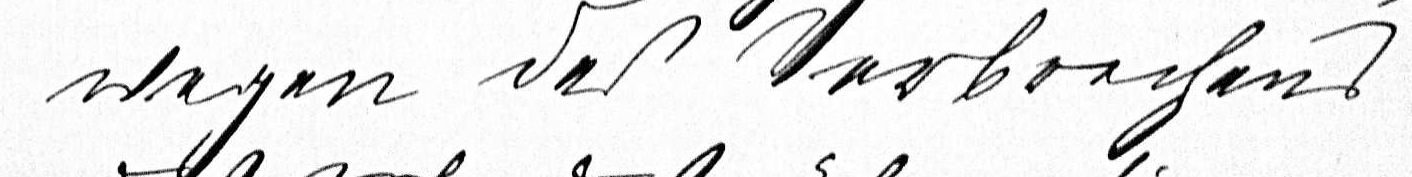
wegen des Verbrechens
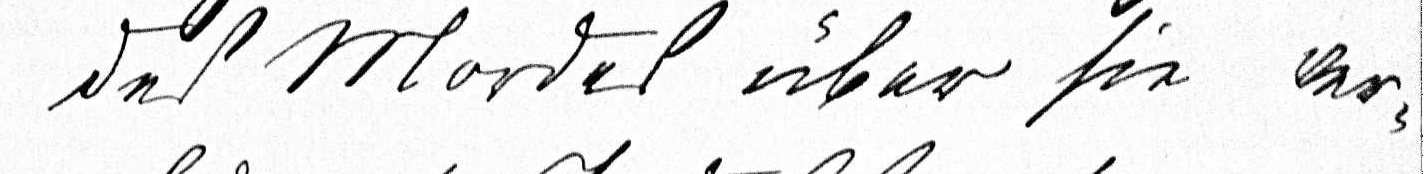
des Mordes über sie ver¬
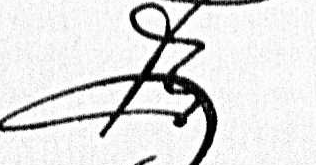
FJ
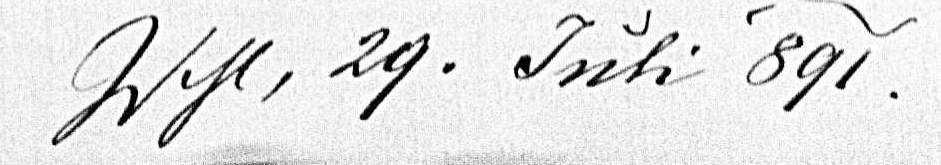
Ischl 29. Juli 1891
